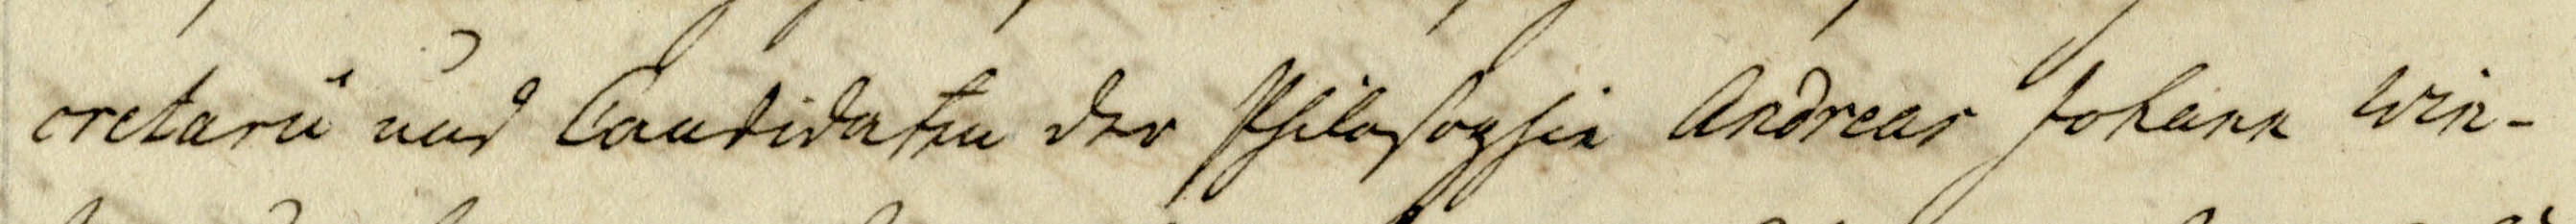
cretarii und Candidaten der Philosophie Andreas Johann Win¬
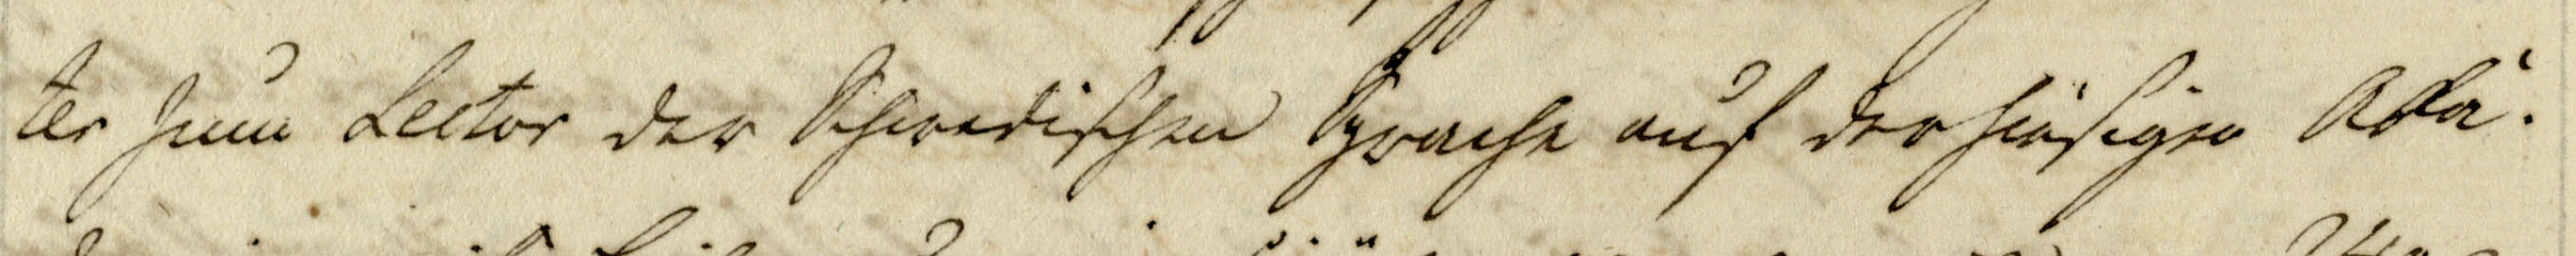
ter zum Lector der Schwedischen Sprache auf der hiesigen Aka¬
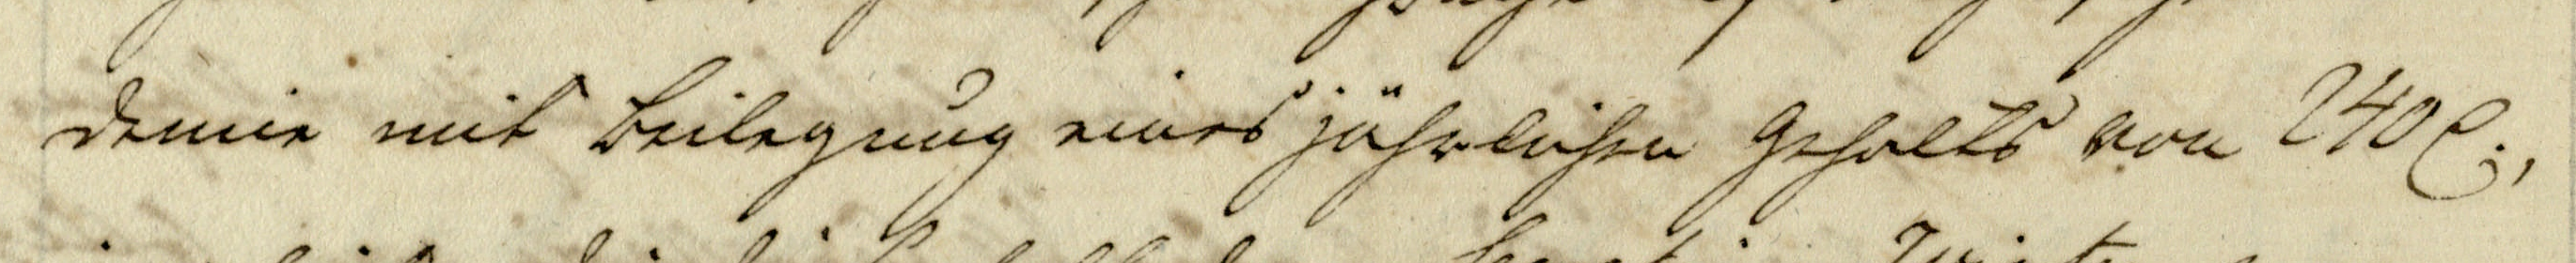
demie mit Beilegung eines jährlichen Gehalts von 240 l.,
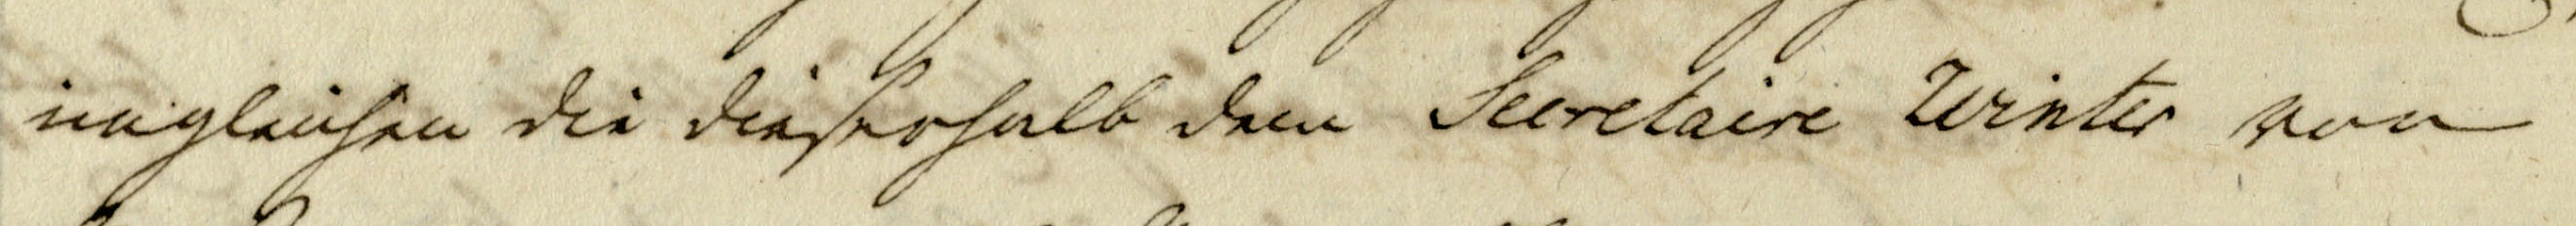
imgleichen die dieserhalb dem Secretaire Winter von
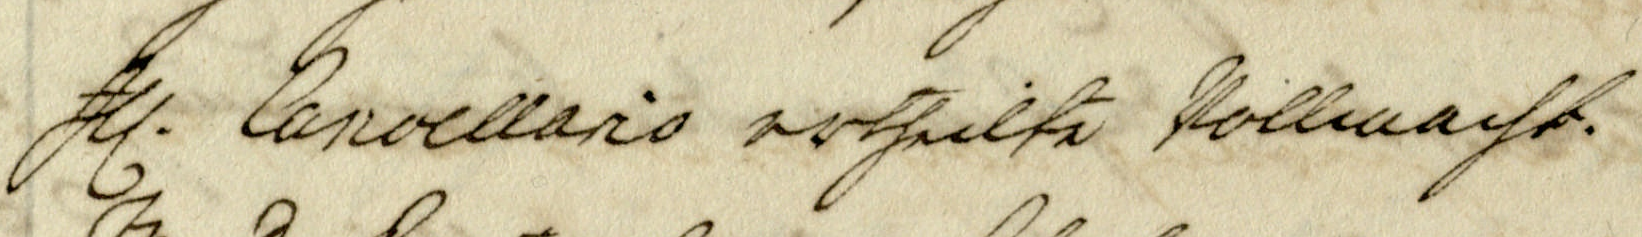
Ill. Cancellario ertheilte Vollmacht.
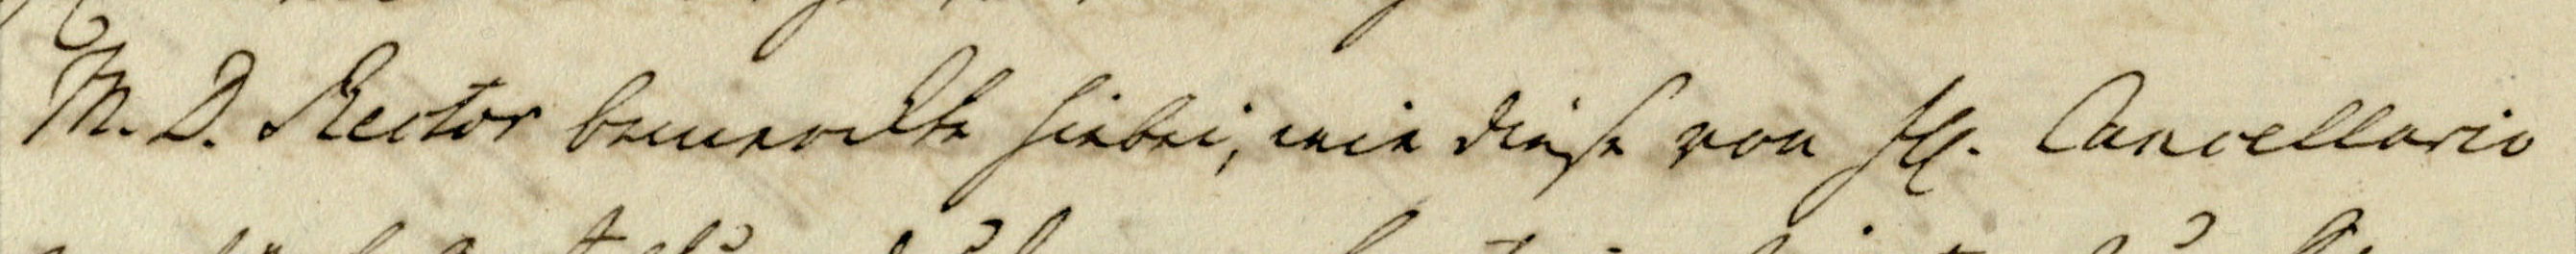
M. D. Rector bemerckte hiebei, wie diese von Ill. Cancellario
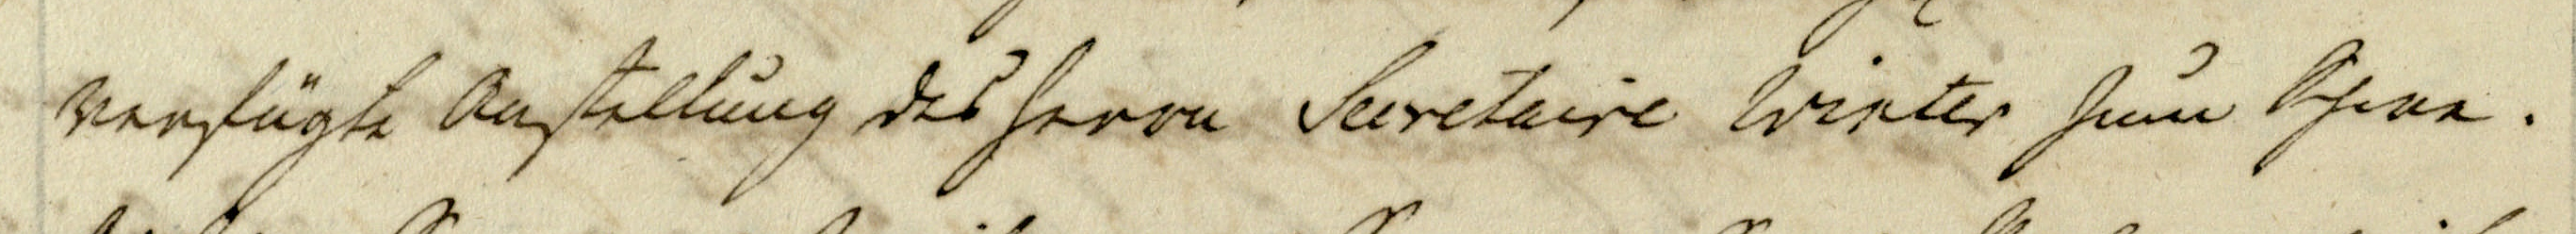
verfügte Anstellung des Herrn Secretaire Winter zum Schwe¬
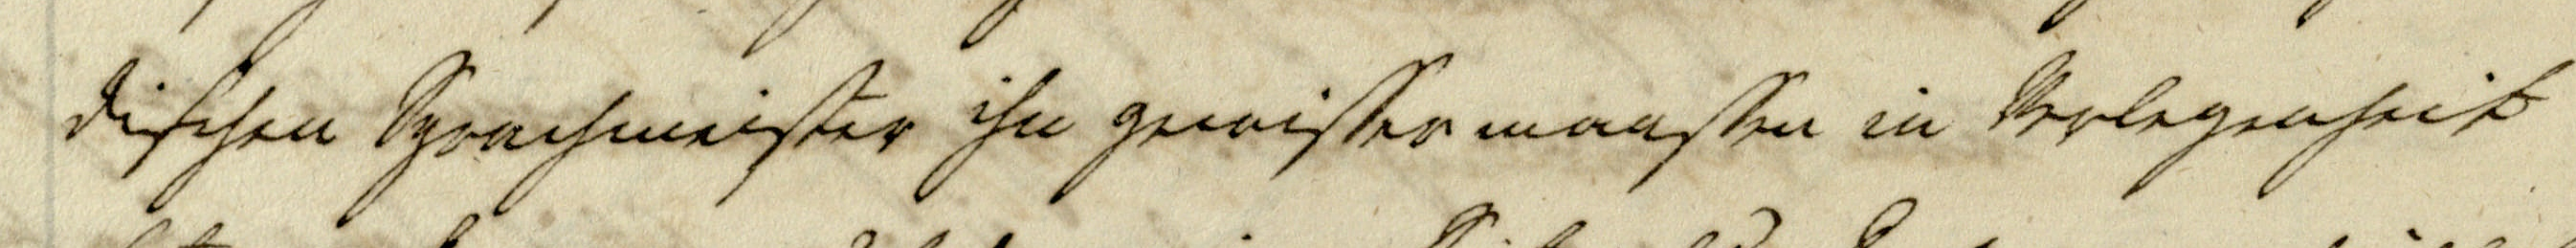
dischen Sprachmeister ihn gewissermaassen in Verlegenheit
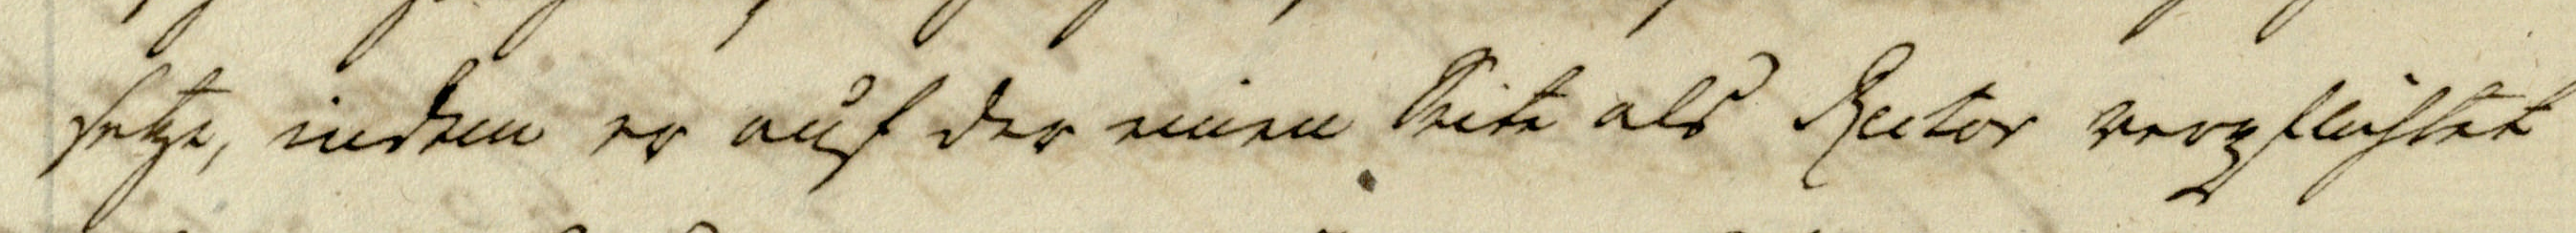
setze, indem er auf der einen Seite als Rector verpflichtet
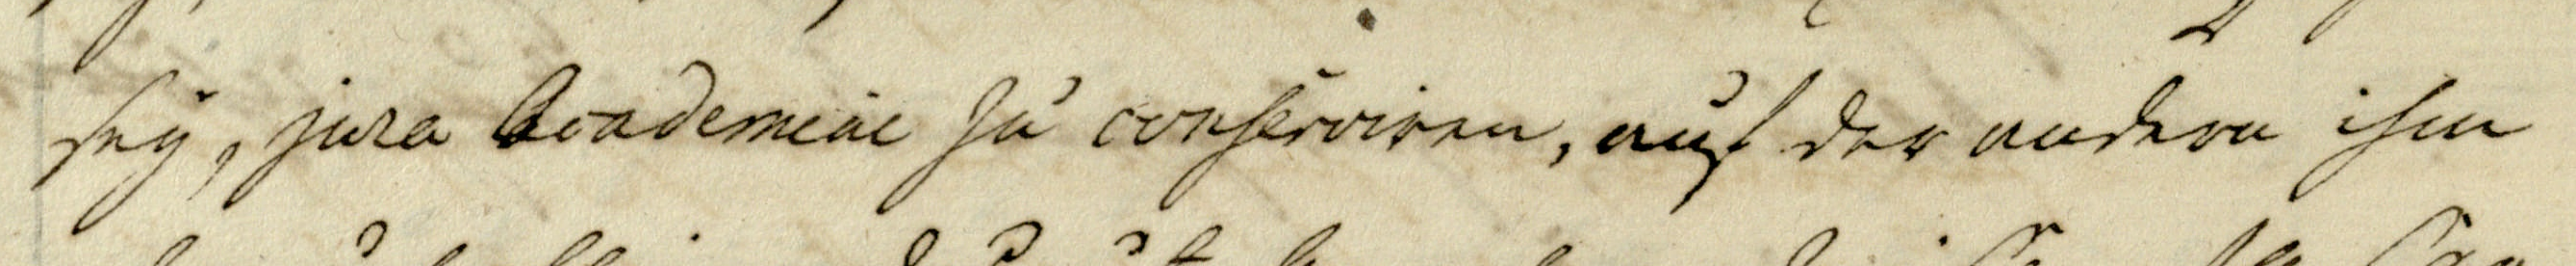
seÿ, jura Academiae zu conserviren, auf der andern ihm
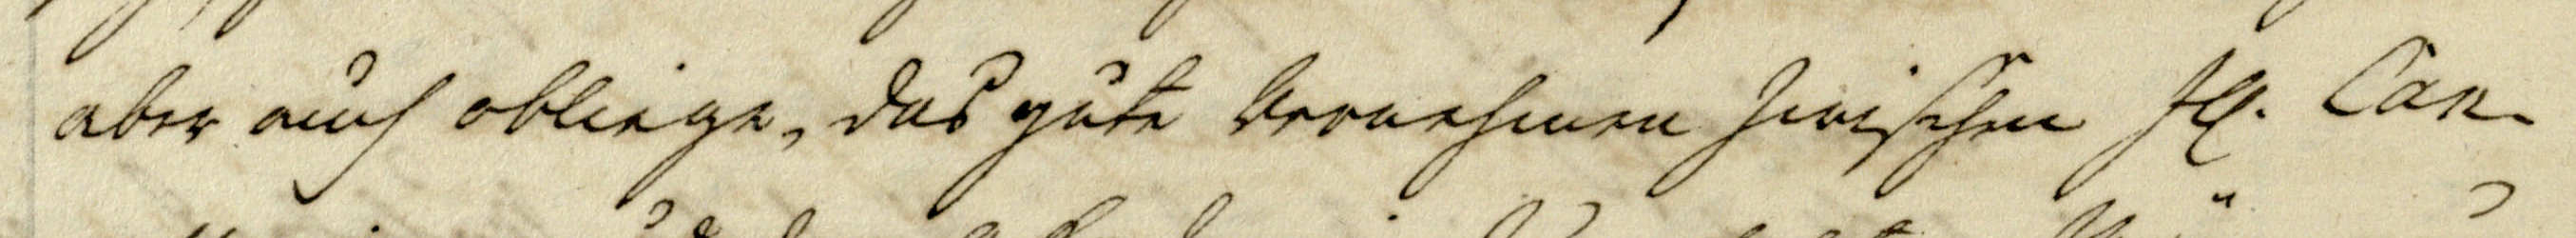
aber auch obliege, das gute Vernehmen zwischen Ill. Can¬
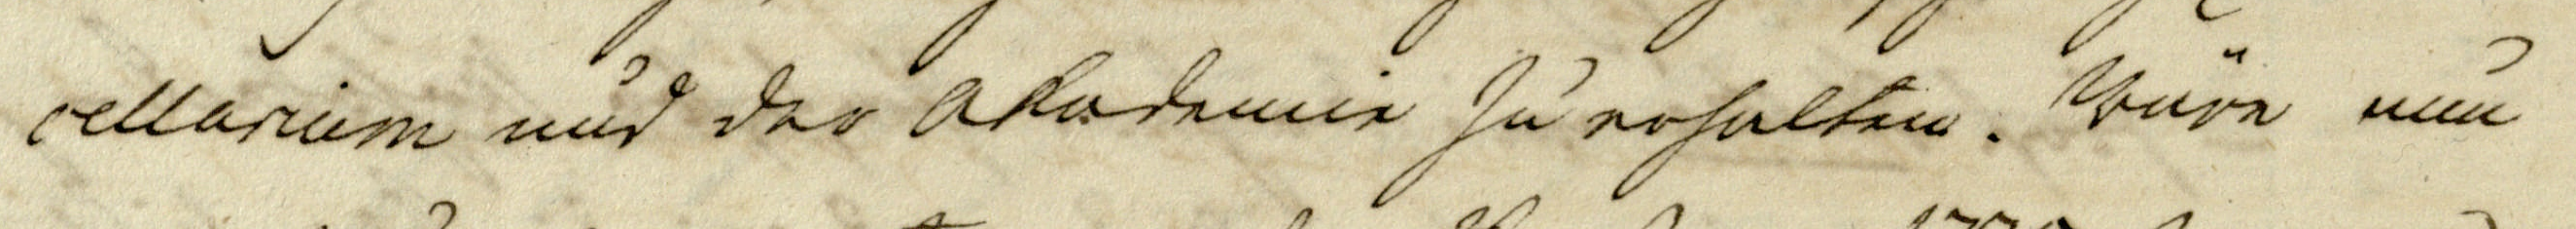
cellarium und der Akademie zu erhalten. Wäre nun
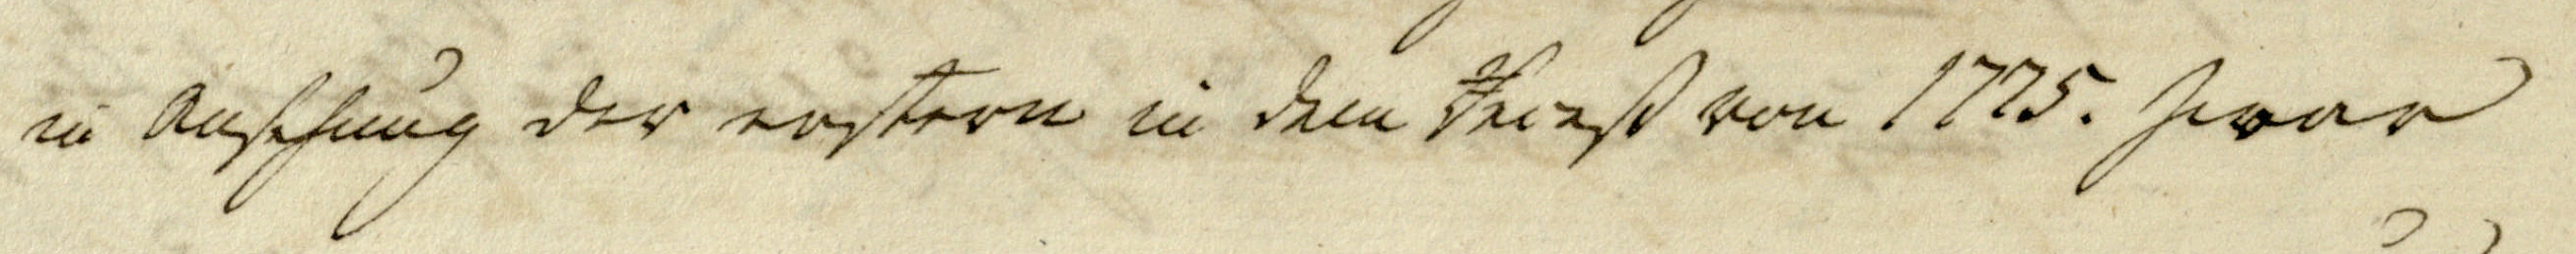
in Ansehung der erstern in dem Receß von 1775. zwar
